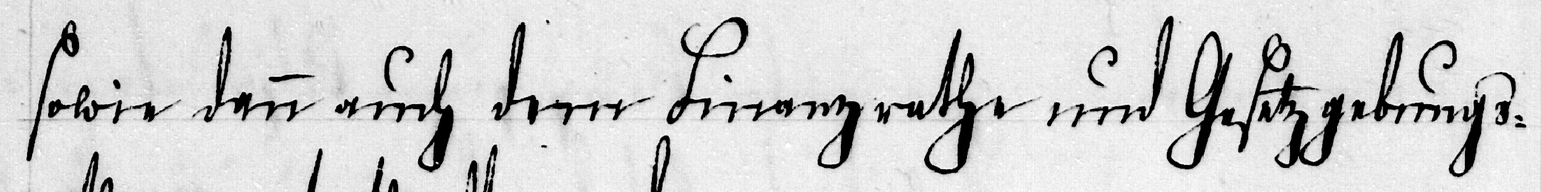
sowie dann auch dem Finanzrathe und Gesetzgebungs¬
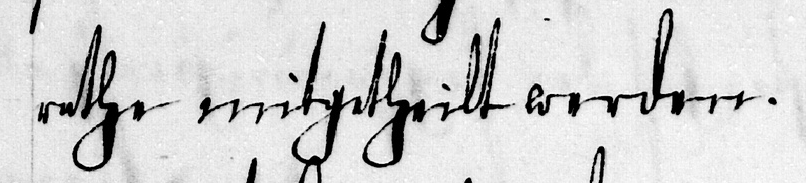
rathe mitgetheilt werden.
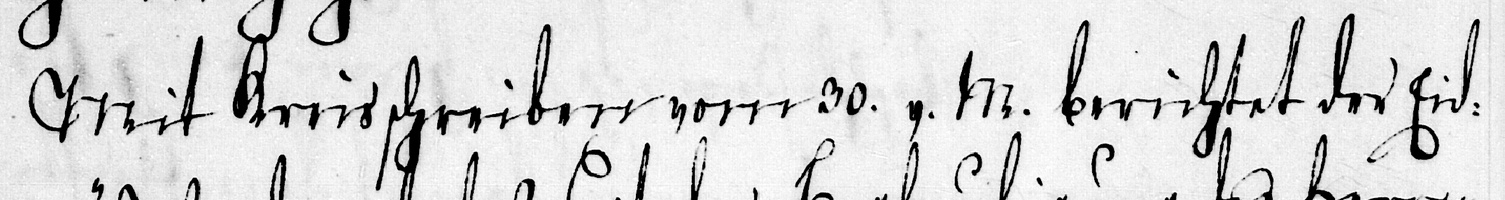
Mit Kreisschreiben vom 30. d. M. berichtet der Eid¬
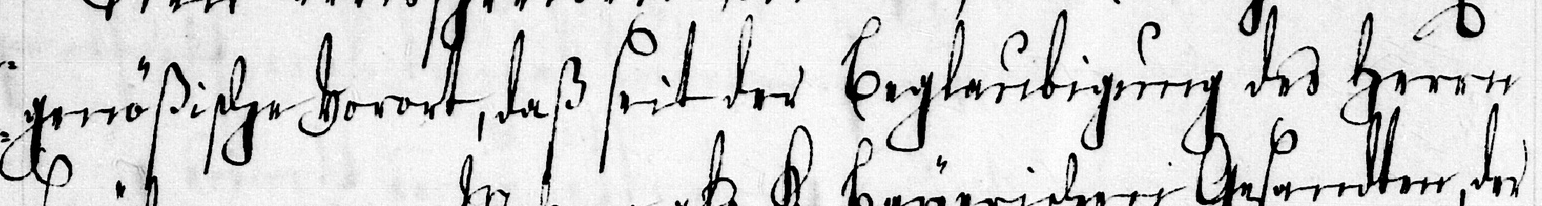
genößische Vorort, daß seit der Beglaubigung des Herrn
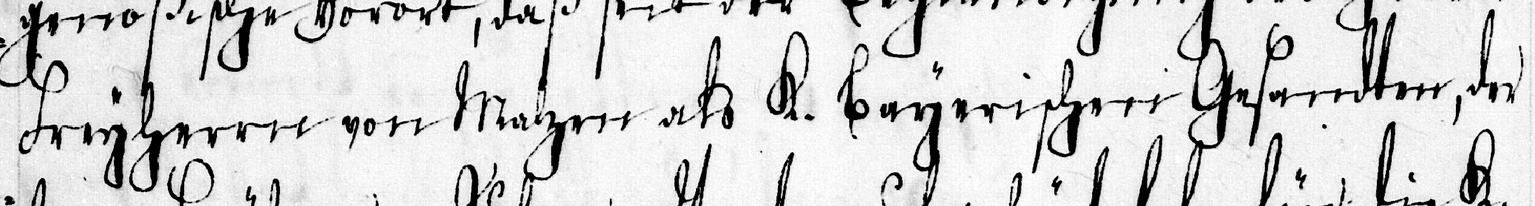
Freyherr von Malzen als K. Bayerischen Gesandten, der
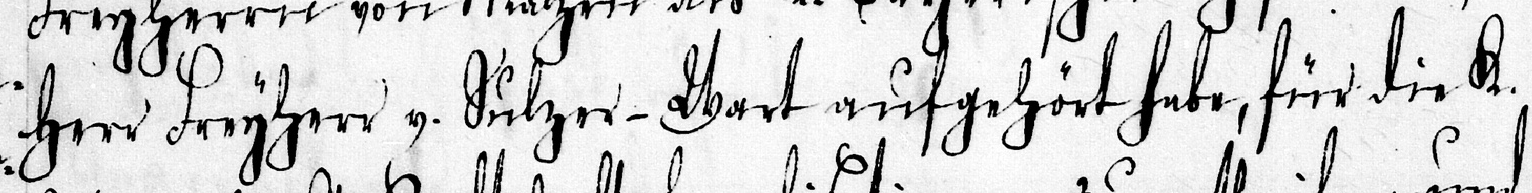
Herr Freyherr v. Sulzer-Wart aufgehört habe, für die K.
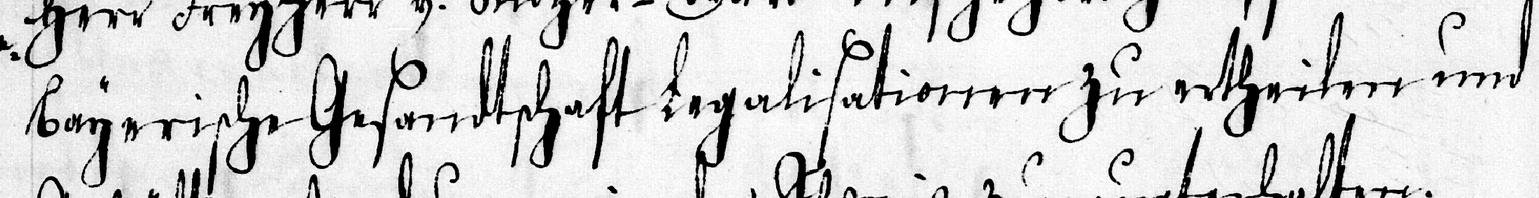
Bayerische Gesandtschaft Legalisationen zu ertheilen und
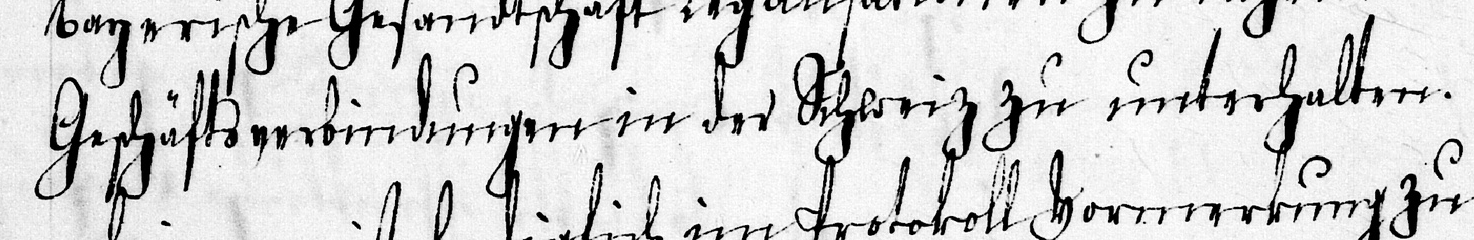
Geschäftsverbindungen in der Schweiz zu unterhalten.
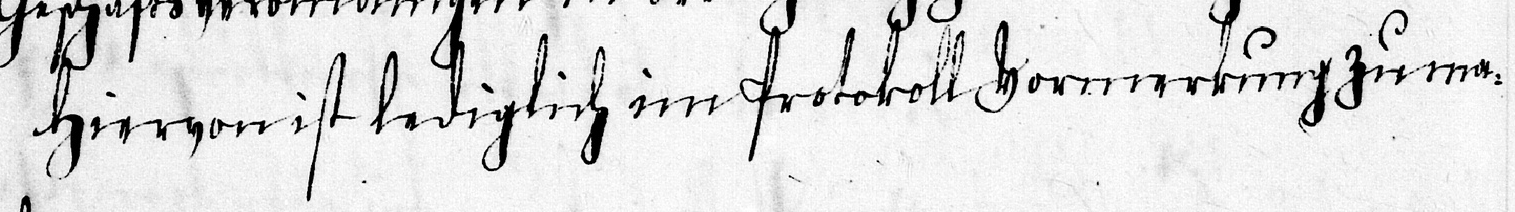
Hiervon ist lediglich im Protokoll Vormerkung zu ma¬
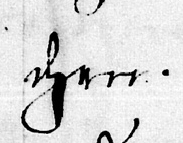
chen.
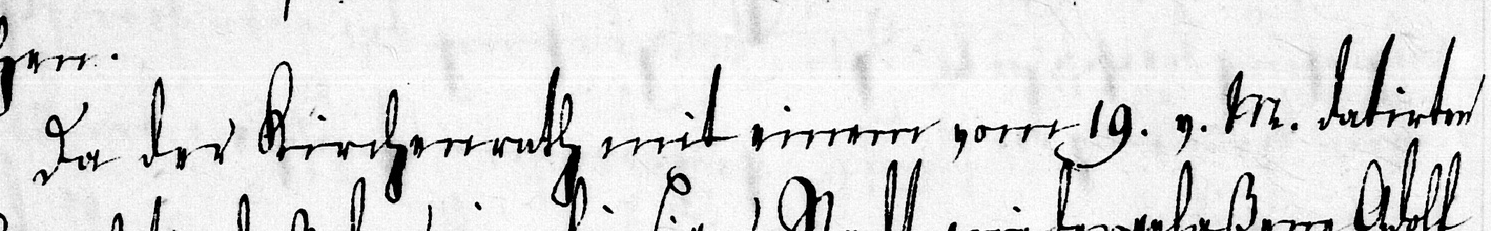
Da der Kirchenrath mit einem vom 19. v. M. datirten
